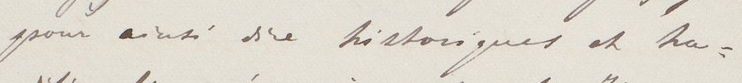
pour ainsi dire historiques et tra-
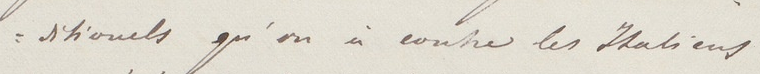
ditionels qu'on à contre les Italiens
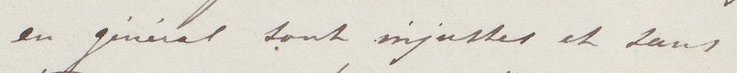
en général sont injustes et sans
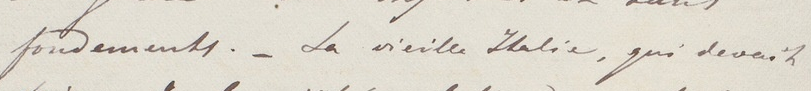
fondements. – La vieille Italie, qui devait
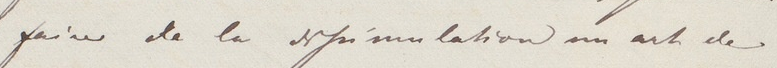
faire de la dissimulation un art de
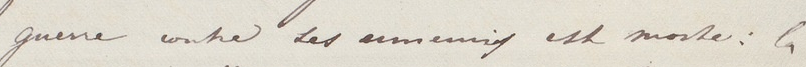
guerre contre ses ennemis est morte: la
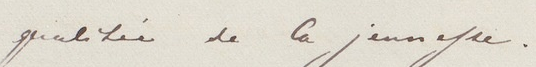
qualitée de ca jeunesse.
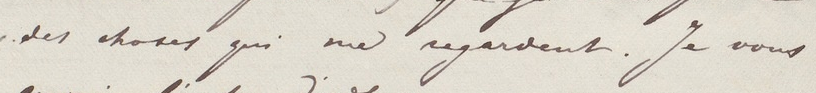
des choses qui me regardent. Je vous
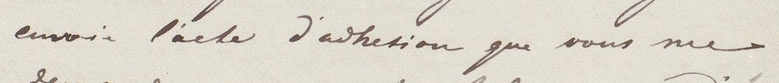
envoie l'acte d'adhesion que vous me
